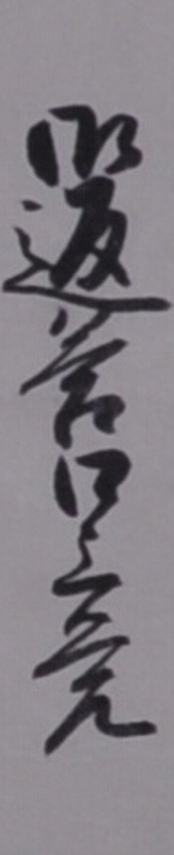御返答口上覚
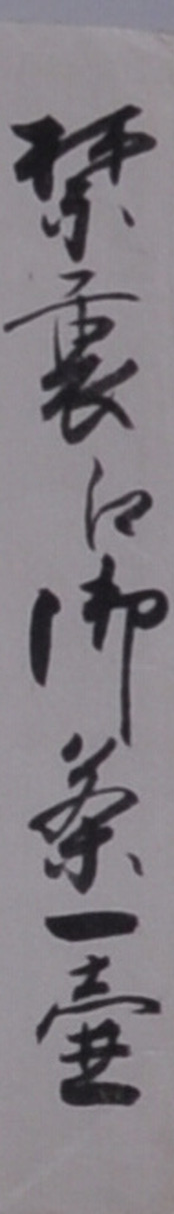禁裏え御茶一壺
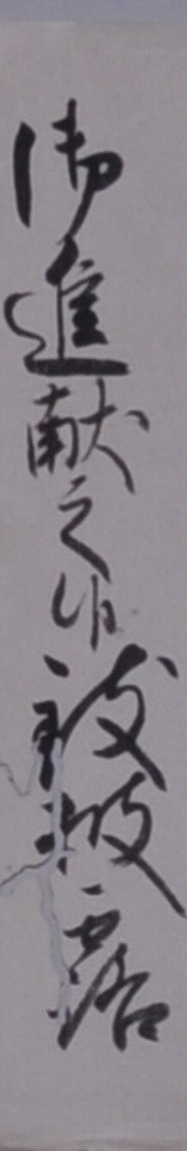御進献之候致披露
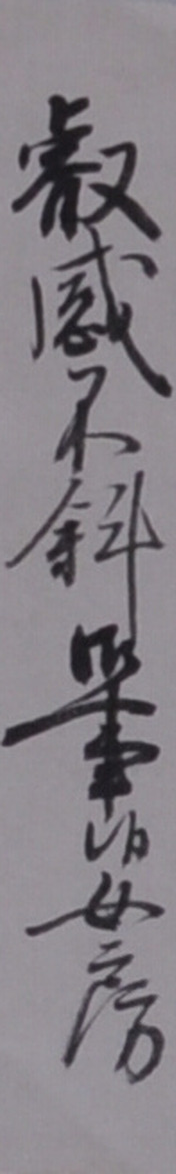叡感不斜御事候女房
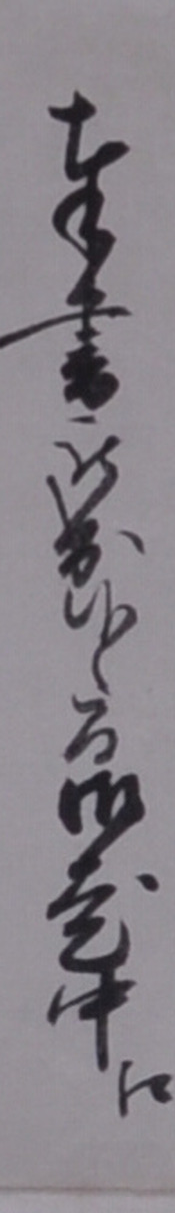奉書被出候之間御老中え
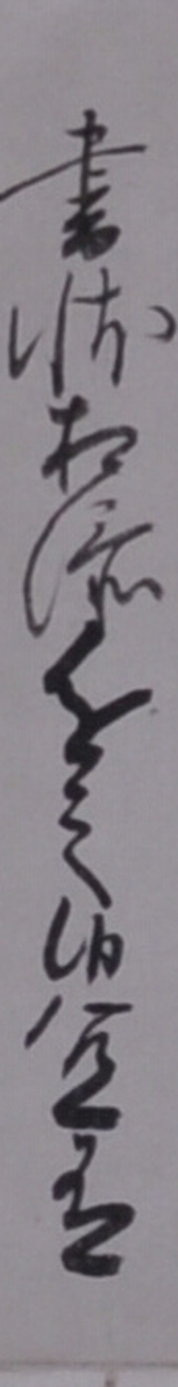書状相添進之候宜有
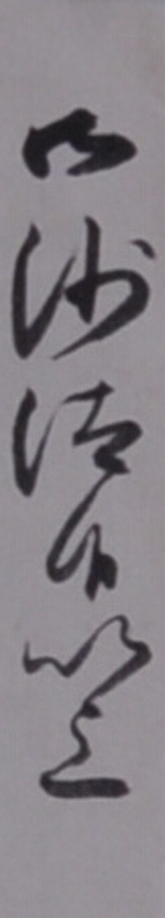御沙汰候以上
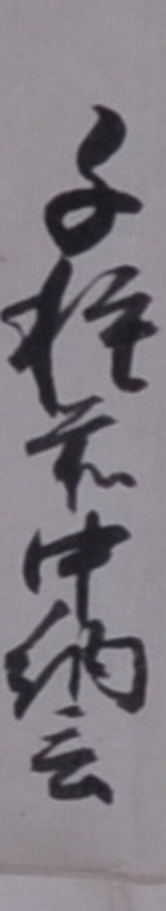千種前中納言
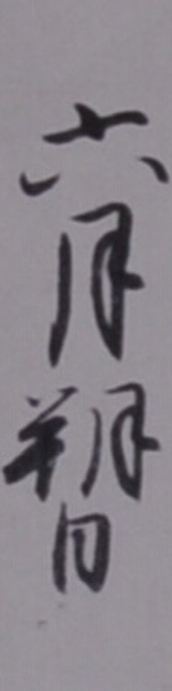六月朔日
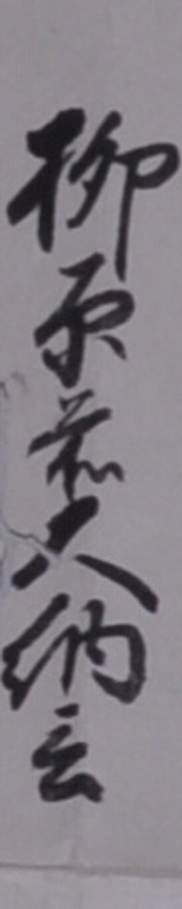柳原前大納言
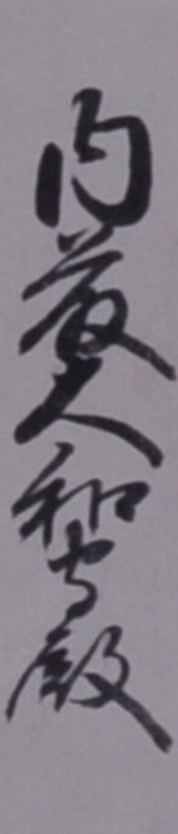内藤大和守殿
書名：御返答口上覚
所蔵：伊那市立高遠町図書館・合同会社AMANE
